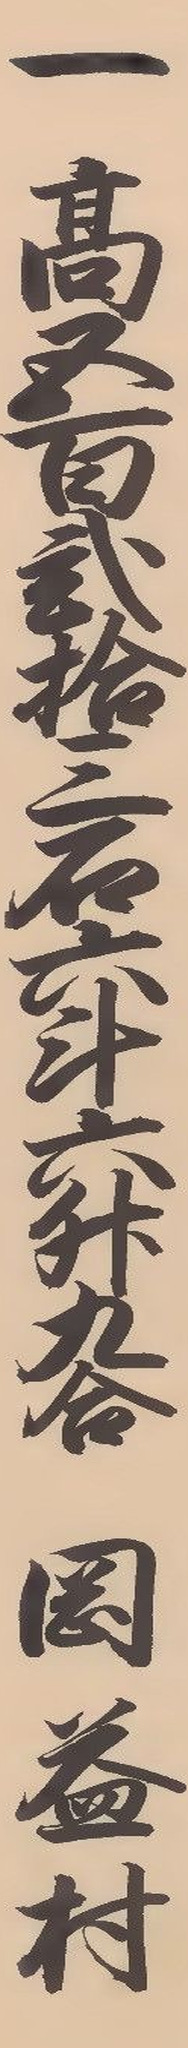一高五百弐拾三石六斗六升九合岡益村
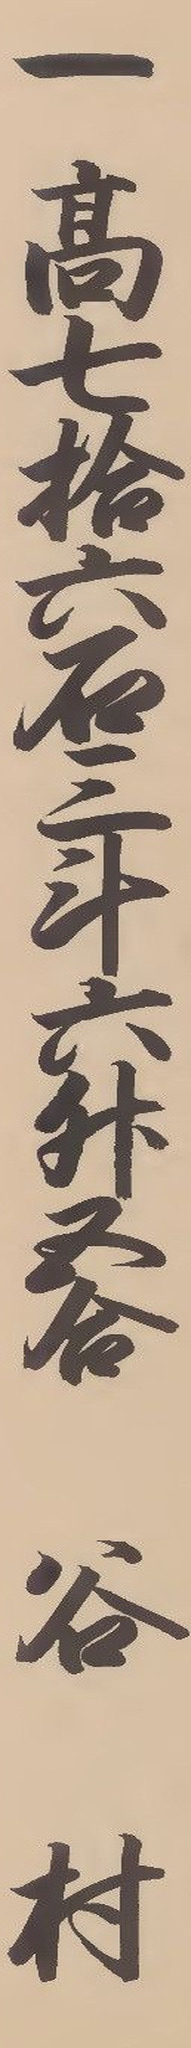一高七拾六石三斗六升五合谷村
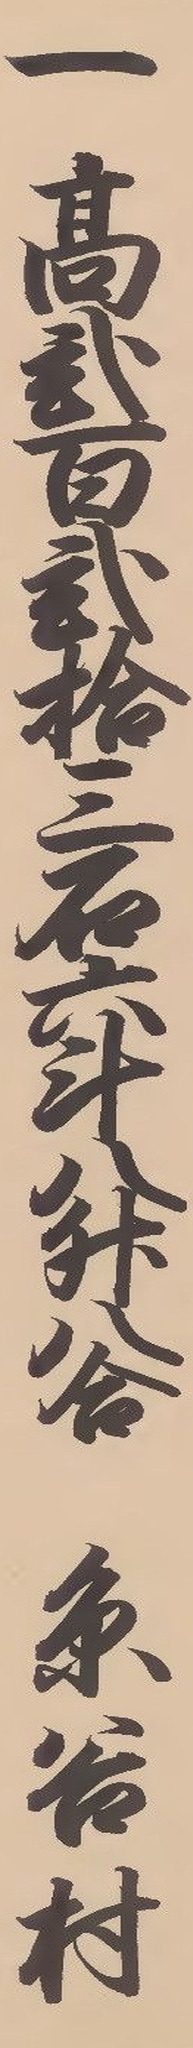一高弐百弐拾三石六斗八升八合糸谷村
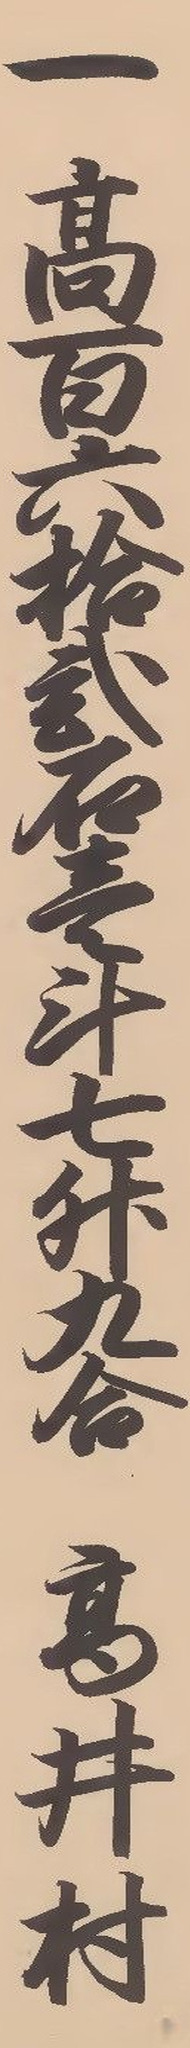一高百六拾弐石壱斗七升九合高井村
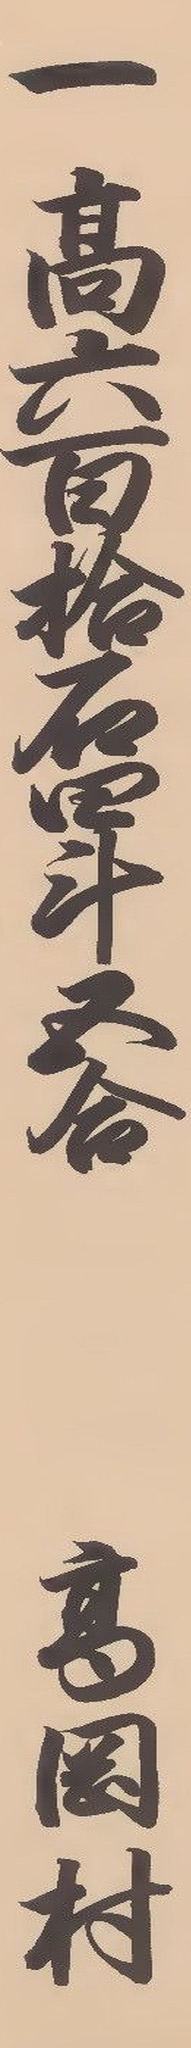一高六百拾石四斗五合高岡村

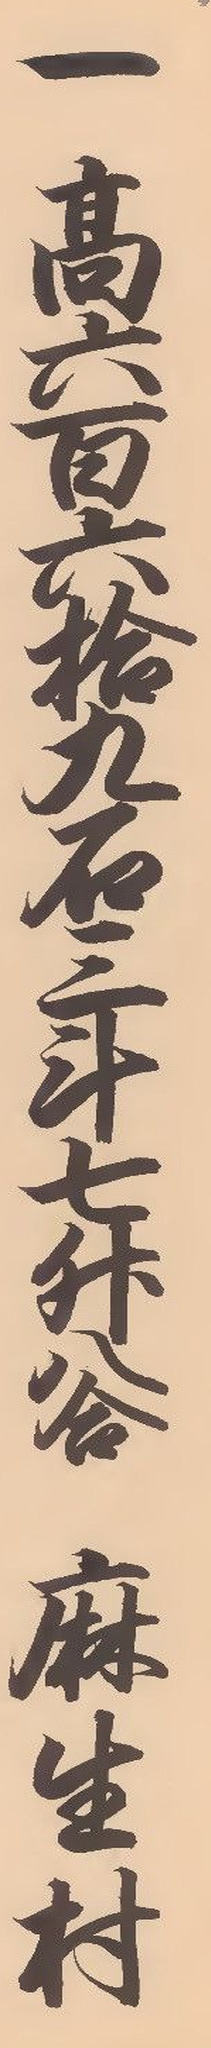一高六百六拾九石三斗七升八合麻生村
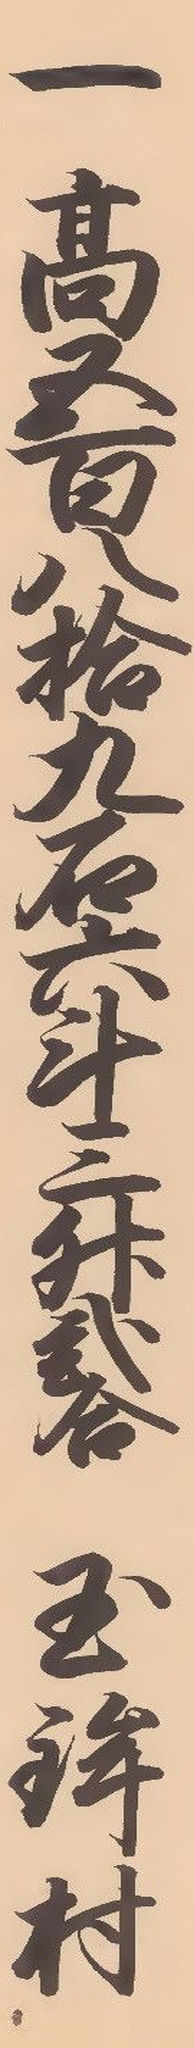一高五百八拾九石六斗三升弐合玉鉾村
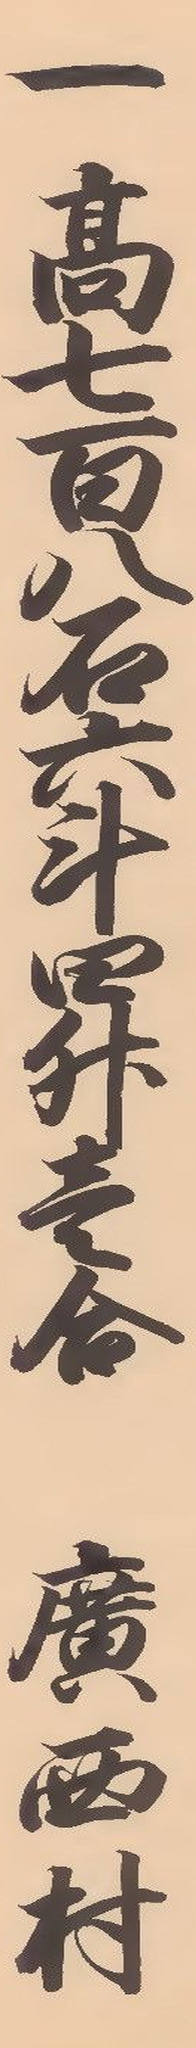一高七百八石六斗四升壱合広西村
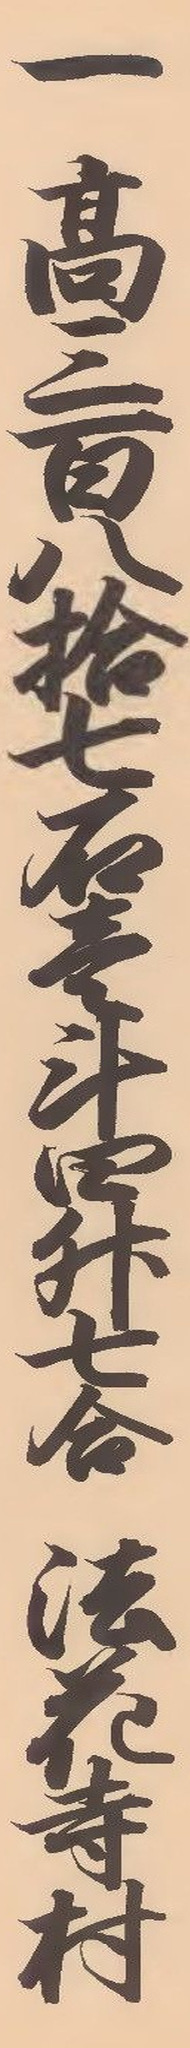一高三百八拾七石壱斗四升七合法花寺村
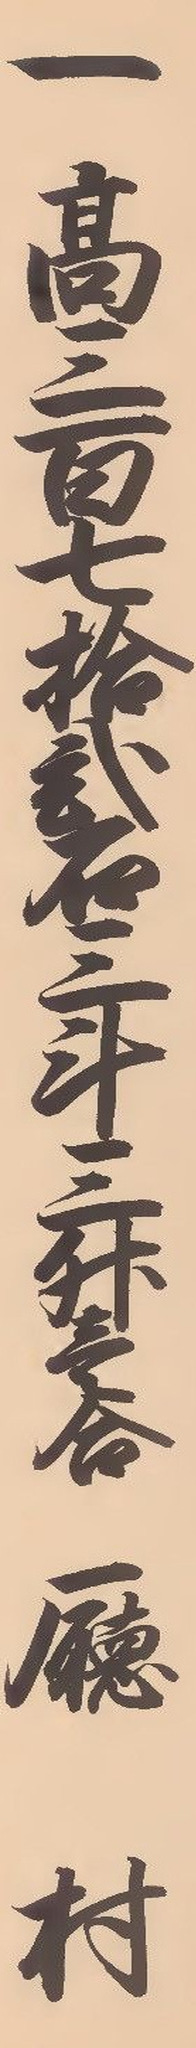一高三百七拾弐石三斗三升壱合庁村
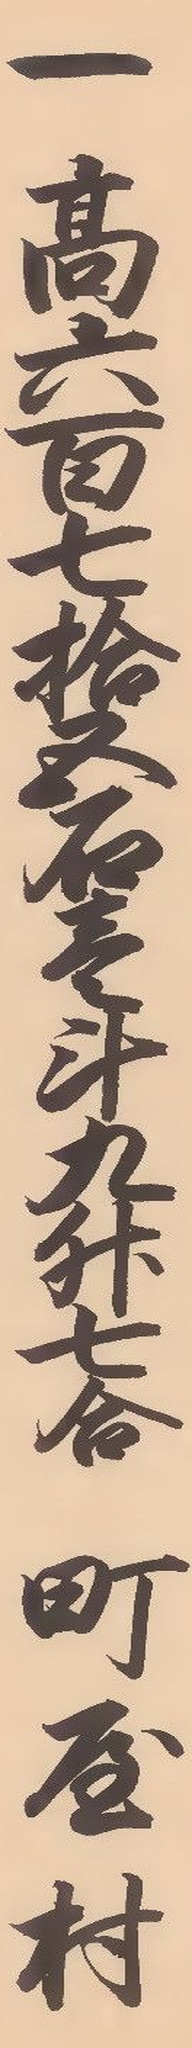一高六百七拾五石壱斗九升七合町屋村
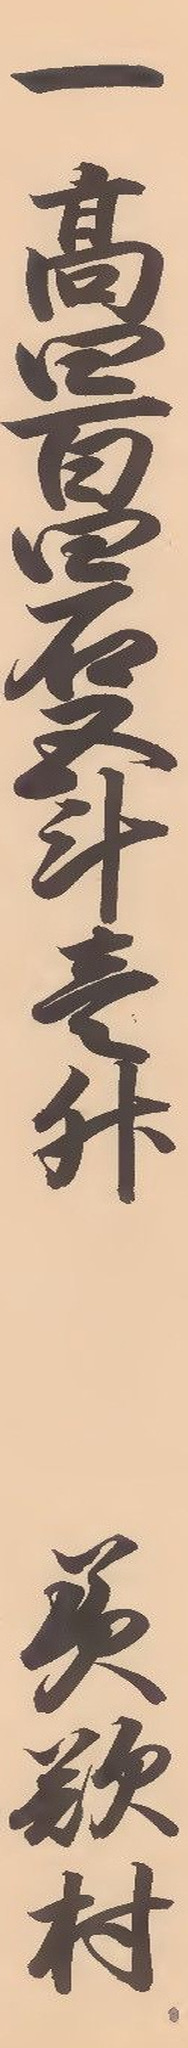一高四百四石五斗壱升美歎村
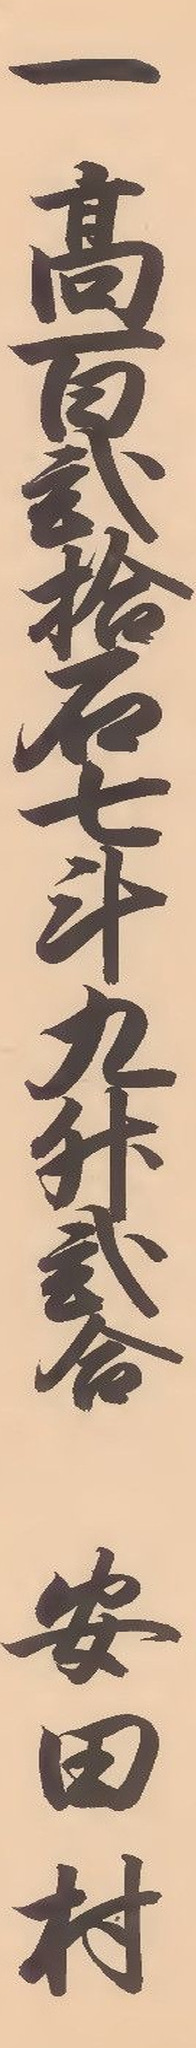一高百弐拾石七斗九升弐合安田村

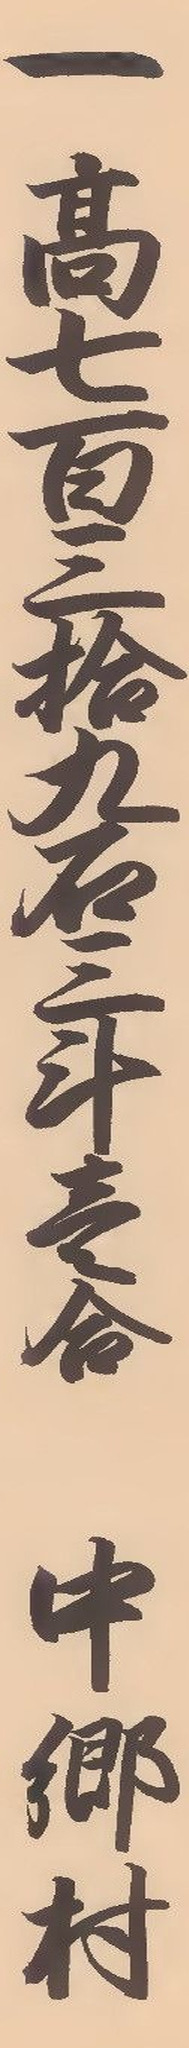一高七百三拾九石三斗壱合中郷村
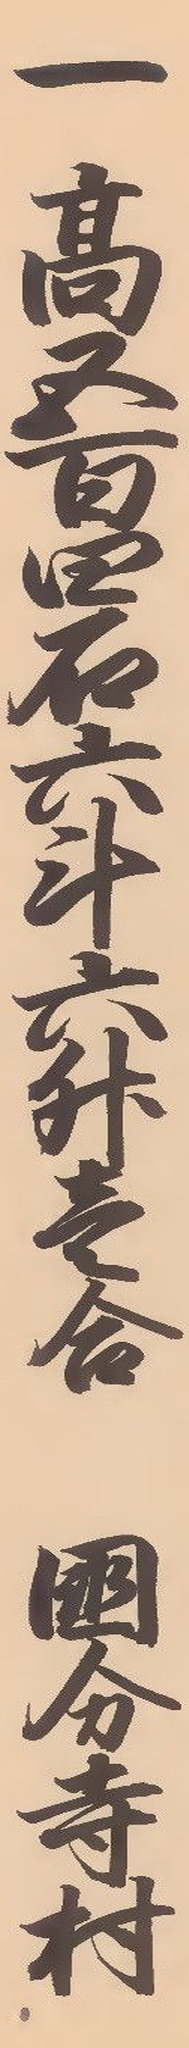一高五百四石六斗六升壱合国分寺村
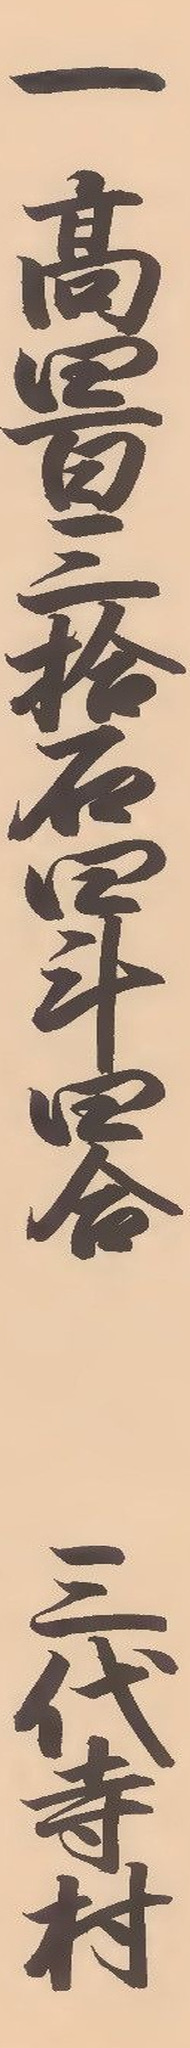一高四百三拾石四斗四合三代寺村
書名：因幡国郷帳
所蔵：国立公文書館 National Archives of Japan
